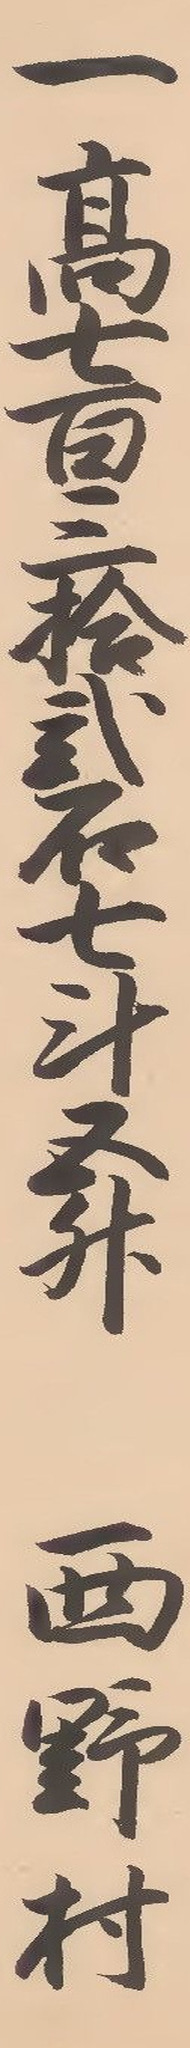一高七百三拾弐石七斗五升西野村
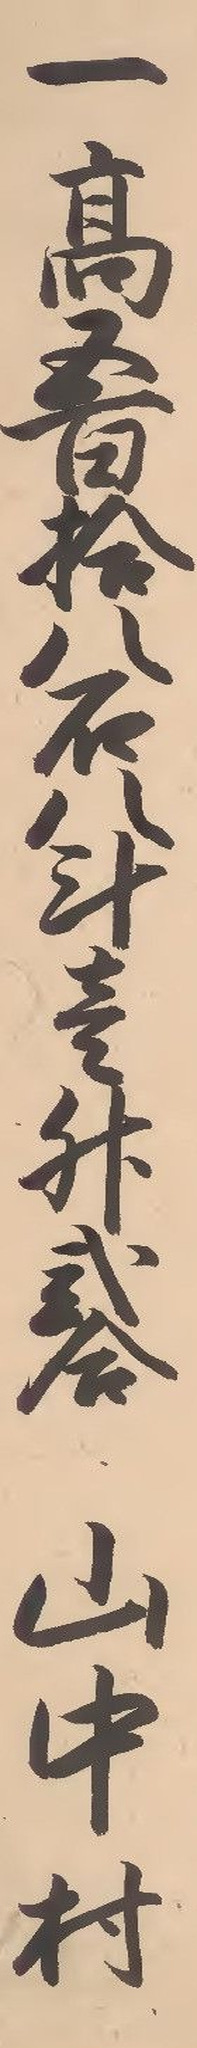一高五百拾八石八斗壱升弐合山中村

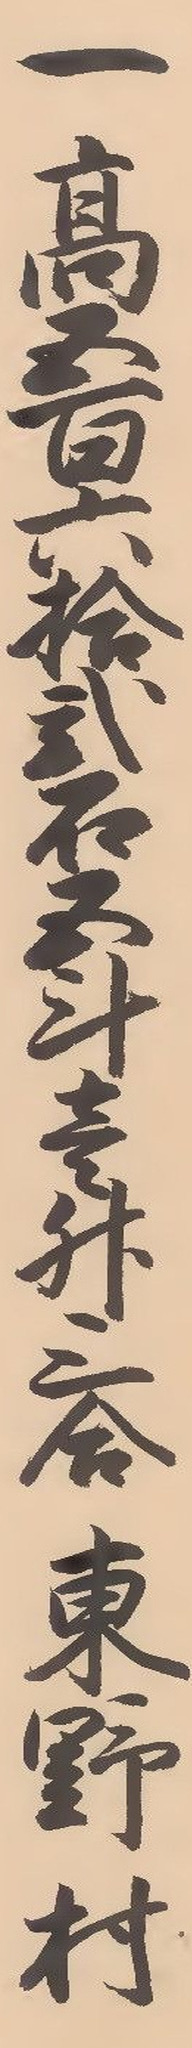一高五百六拾弐石五斗壱升三合東野村
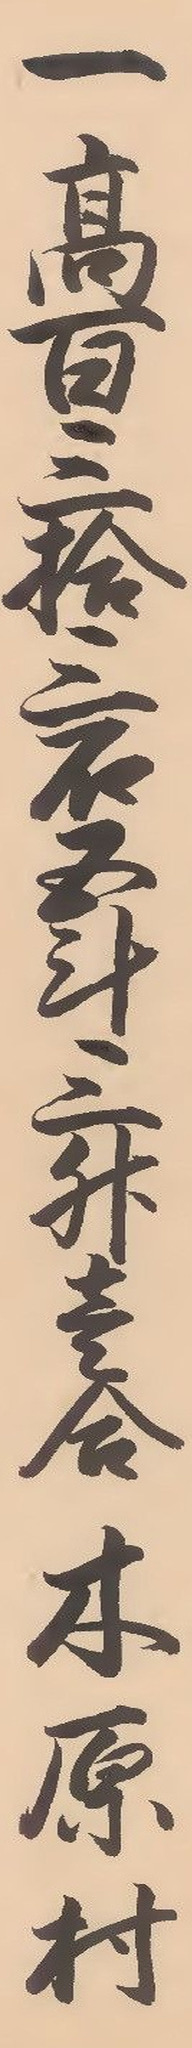一高百三拾三石五斗三升壱合木原村
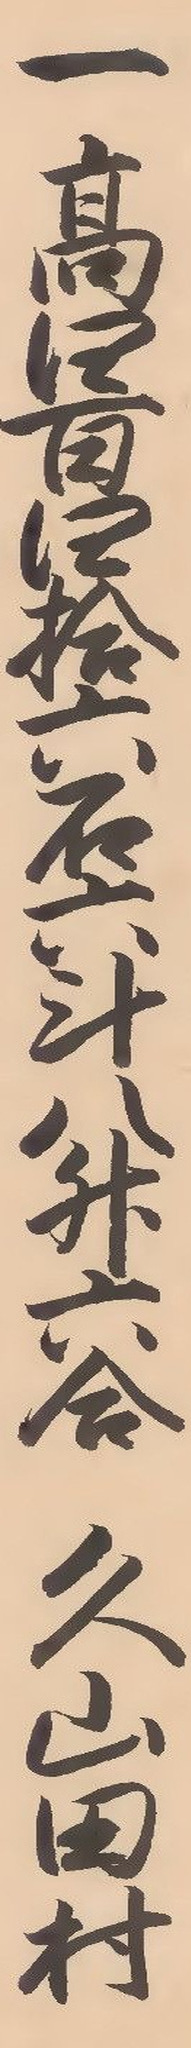一高四百四拾六石六斗八升六合久山田村
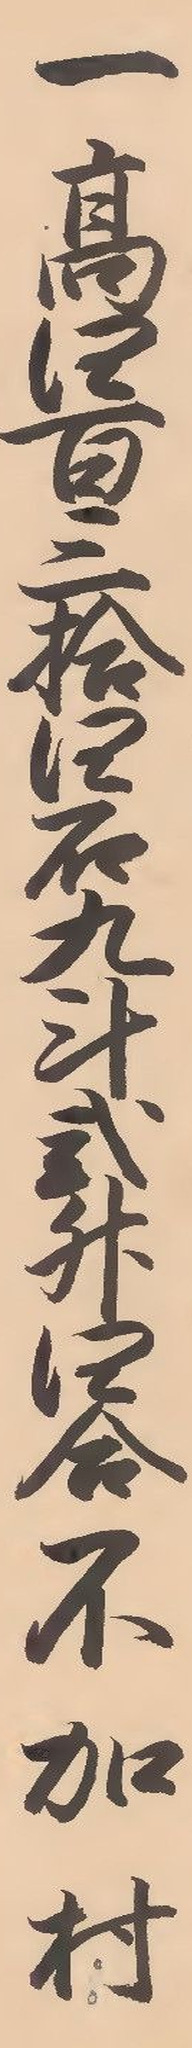一高四百三拾四石九斗弐升四合不加村
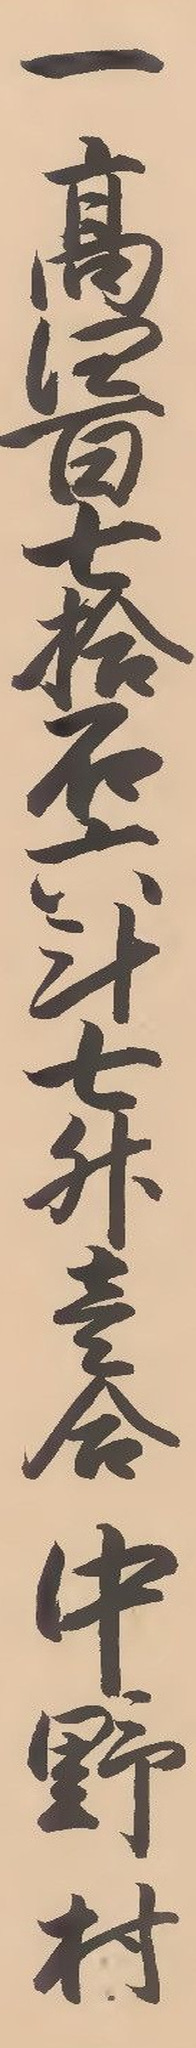一高四百七拾石六斗七升壱合中野村
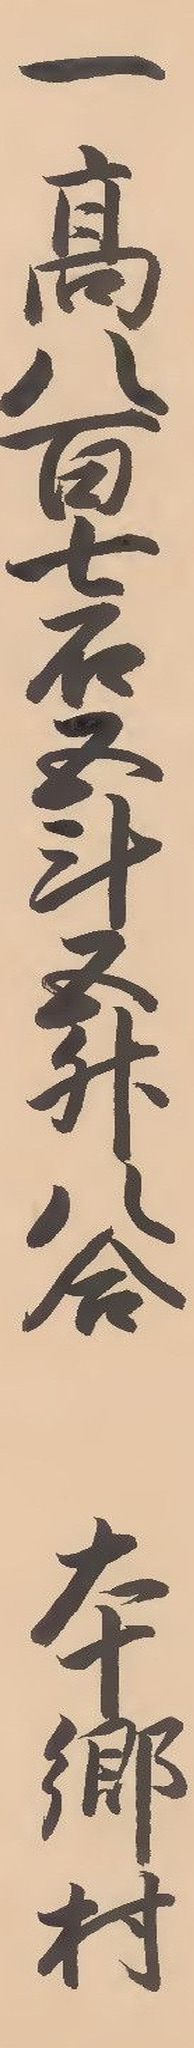一高八百七石五斗五升八合本郷村
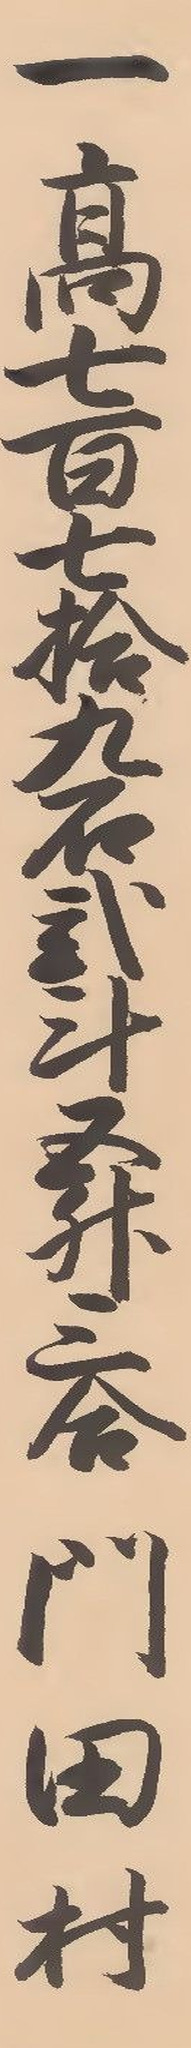一高七百七拾九石弐斗五升三合門田村
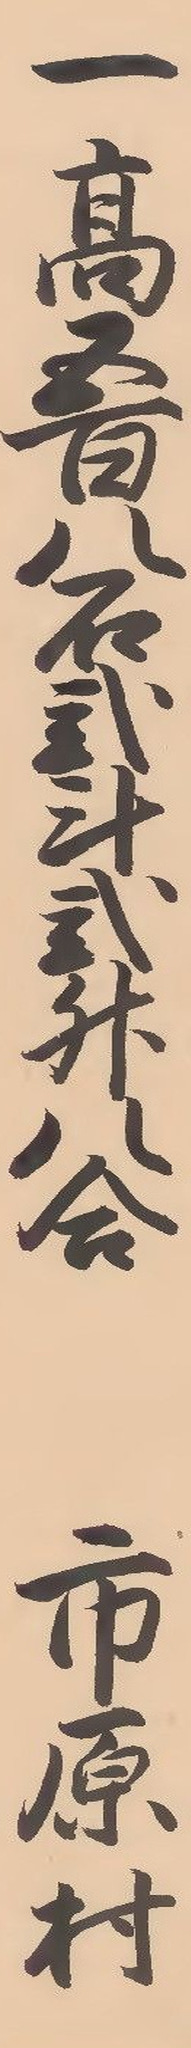一高五百八石弐斗弐升八合市原村

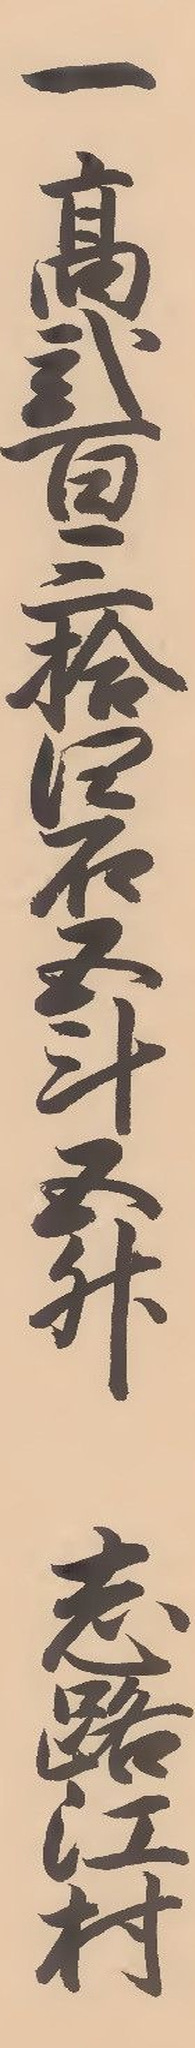一高弐百三拾四石五斗五升志路江村
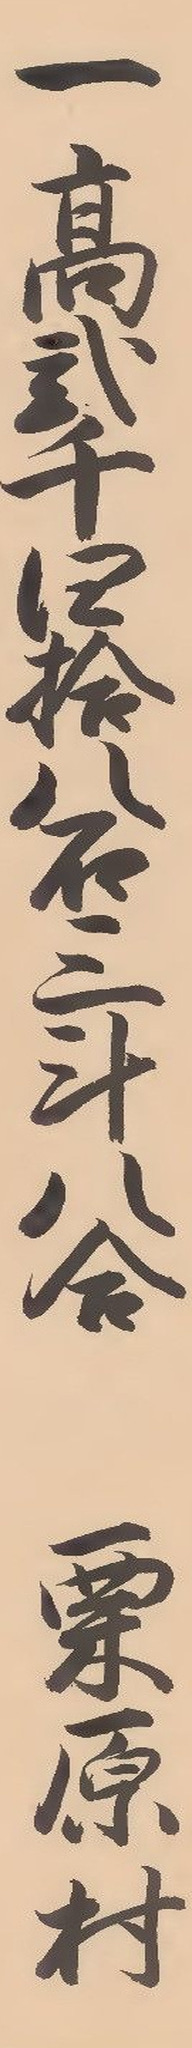一高弐千四拾八石三斗八合栗原村
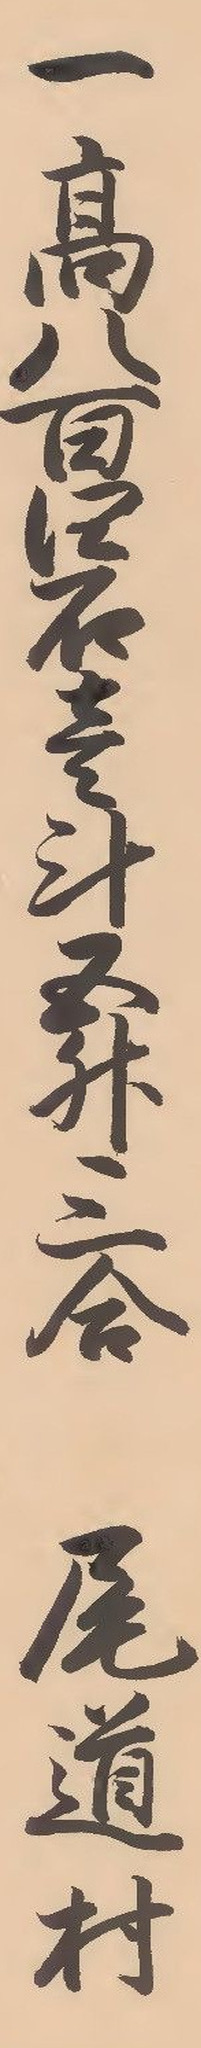一高八百四石壱斗五升三合尾道村
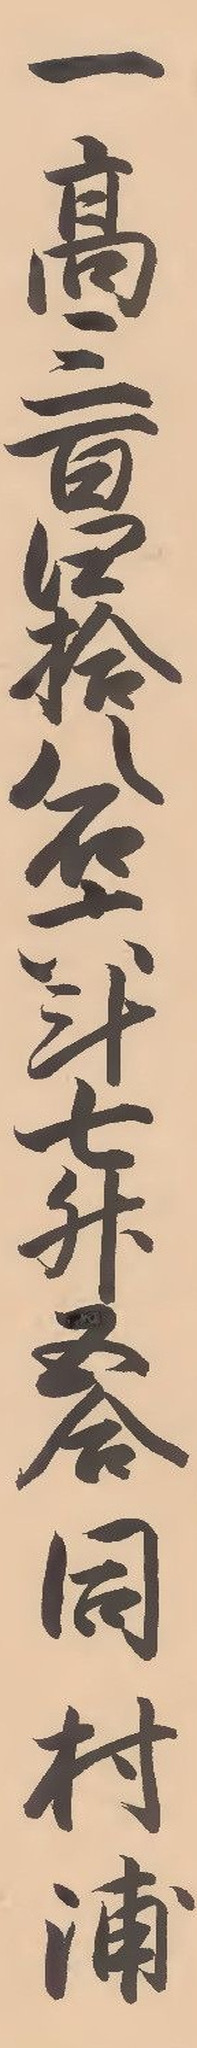一高三百四拾八石六斗七升五合同村浦
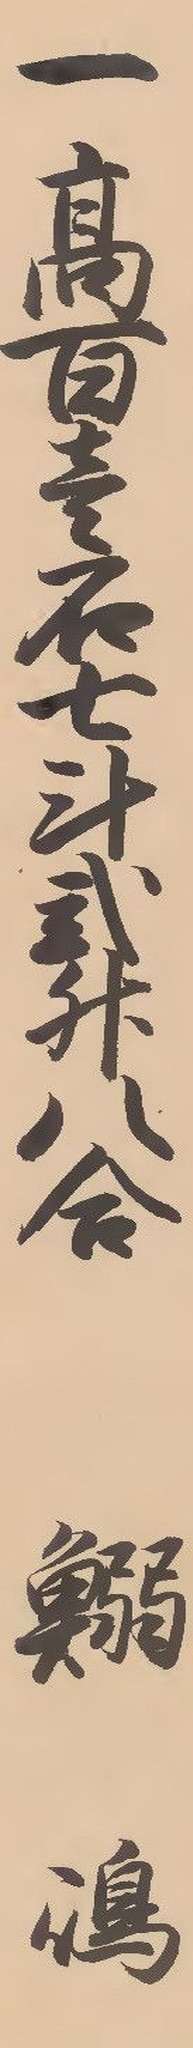一高百壱石七斗弐升八合鰯島
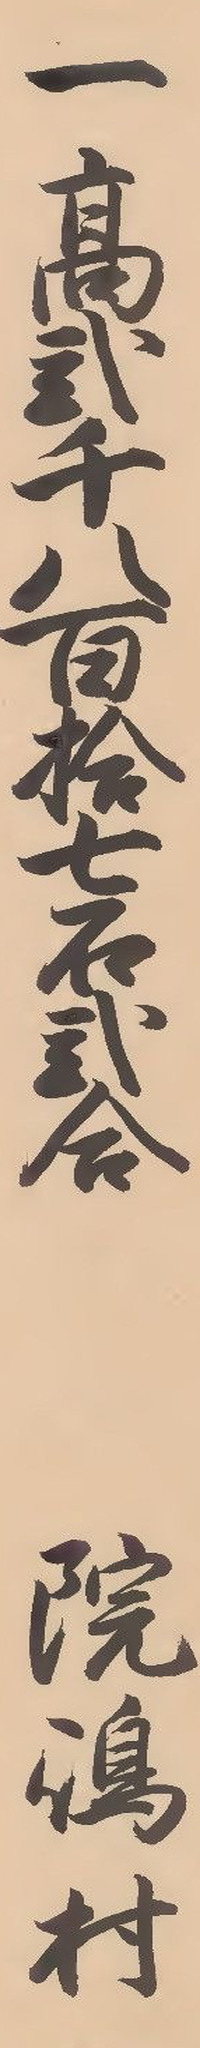一高弐千八百拾七石弐合院島村
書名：備後国郷帳
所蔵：国立公文書館 National Archives of Japan
